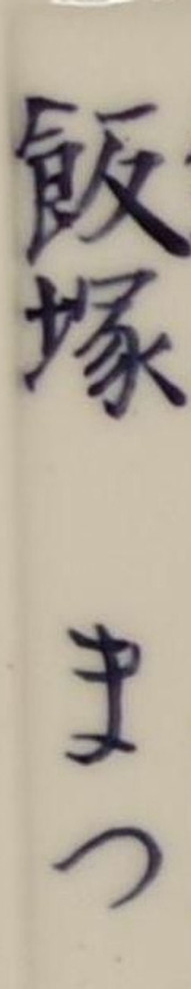飯塚まつ

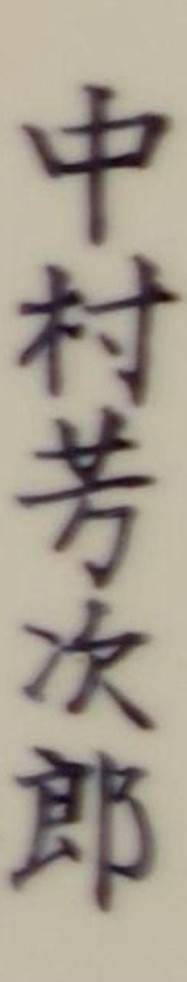中村芳次郎
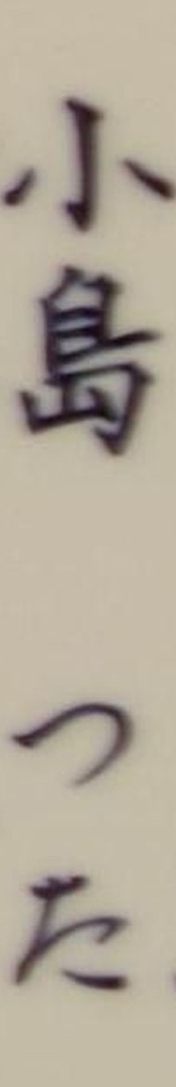小島つた
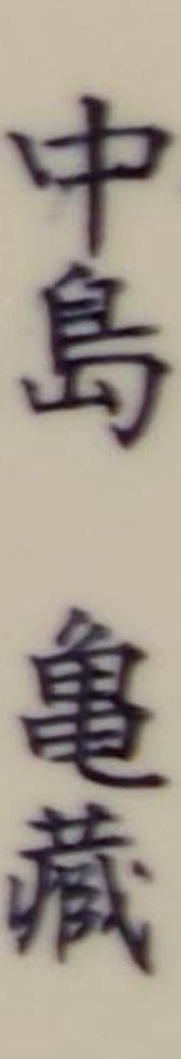中島亀蔵
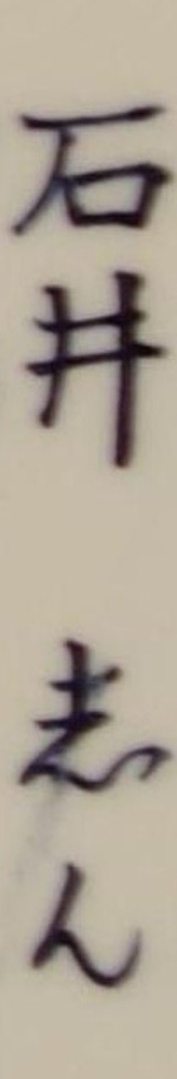石井しん
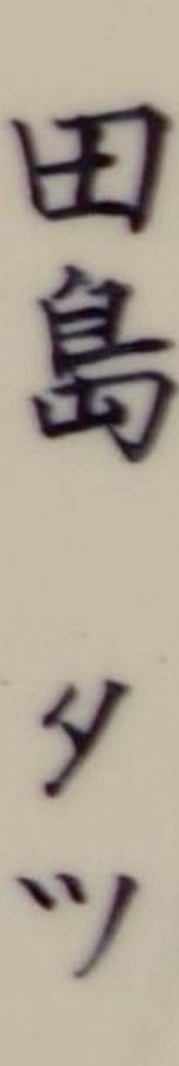田島タツ
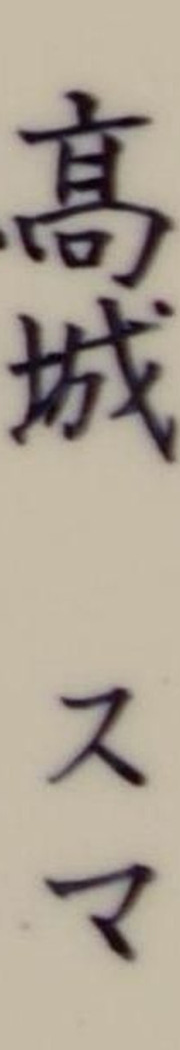高城スマ
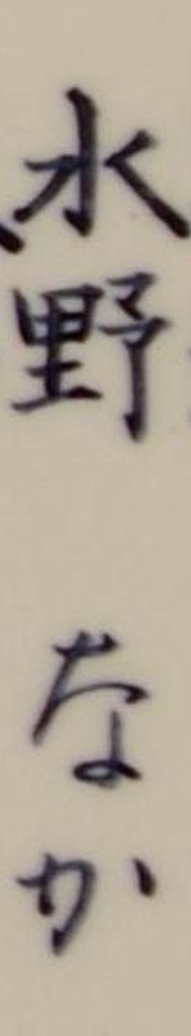水野なか
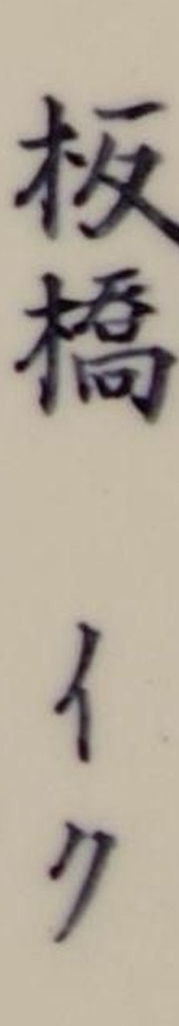板橋イク
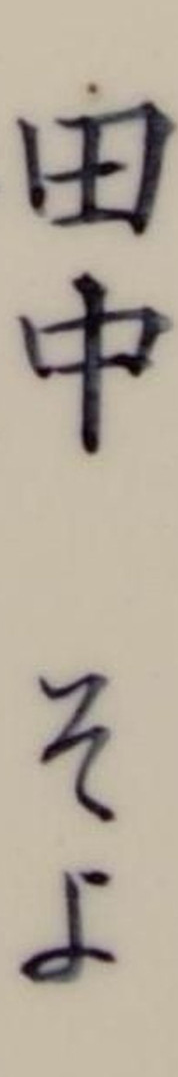田中そよ
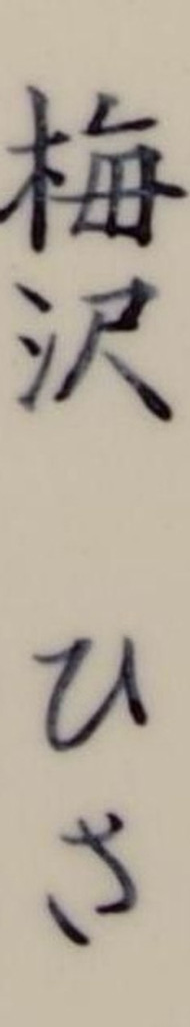梅沢ひさ
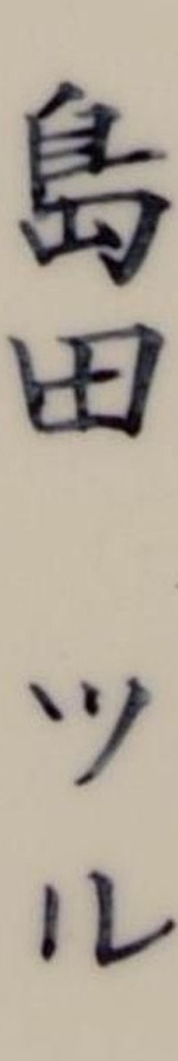島田ツル

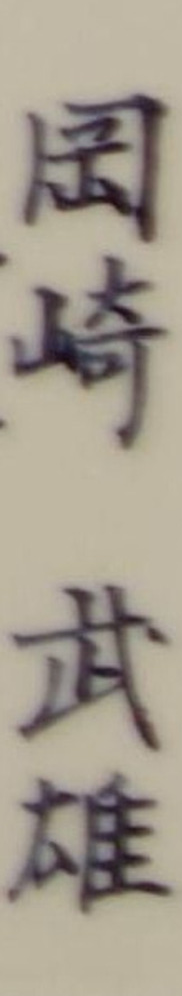岡崎武雄
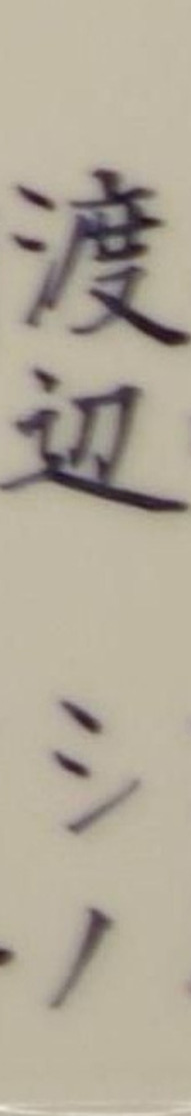渡辺シノ
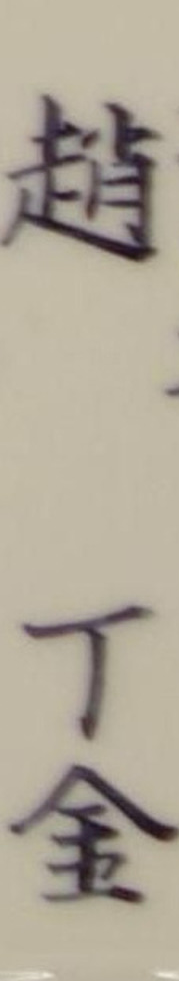趙丁金
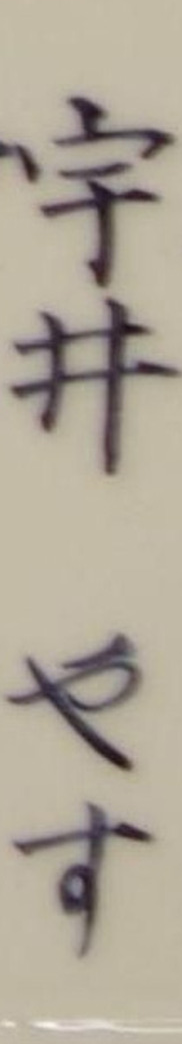宇井やす
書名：M~S
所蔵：高野山金剛峯寺
